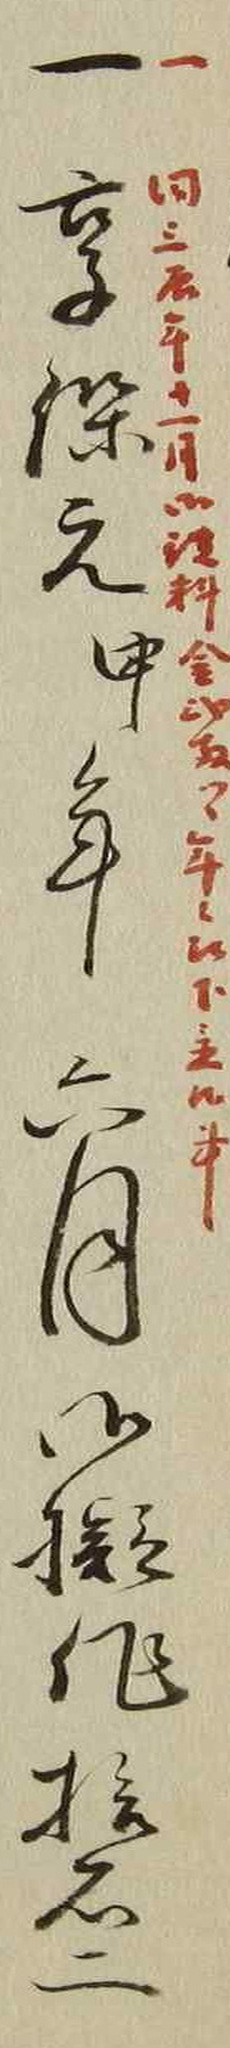一享保元申年六月御擬作拾石二
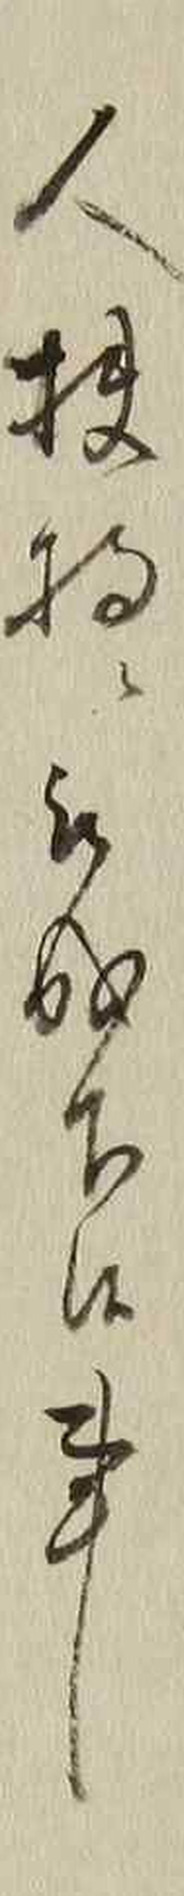人扶持ニ被成下候事
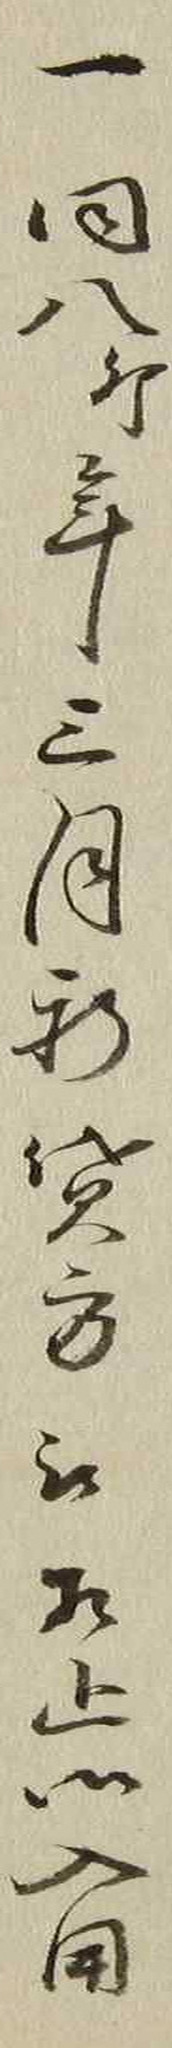一同八卯年三月新貸方被相止御入用
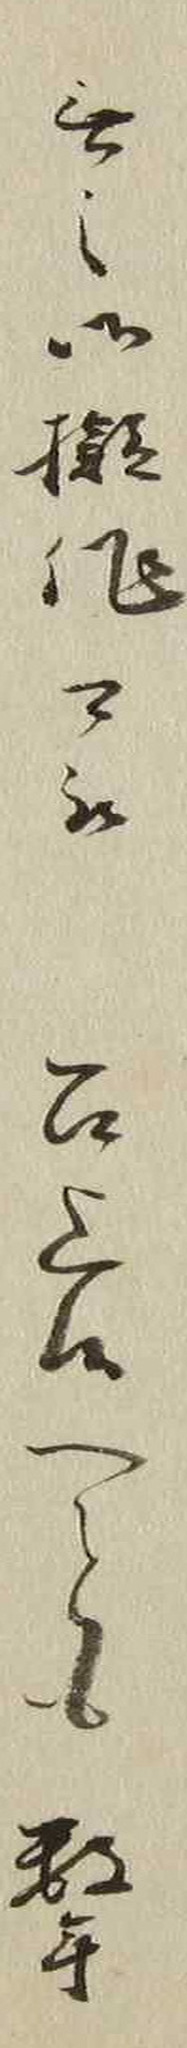無之御擬作可被召上候へとも数年
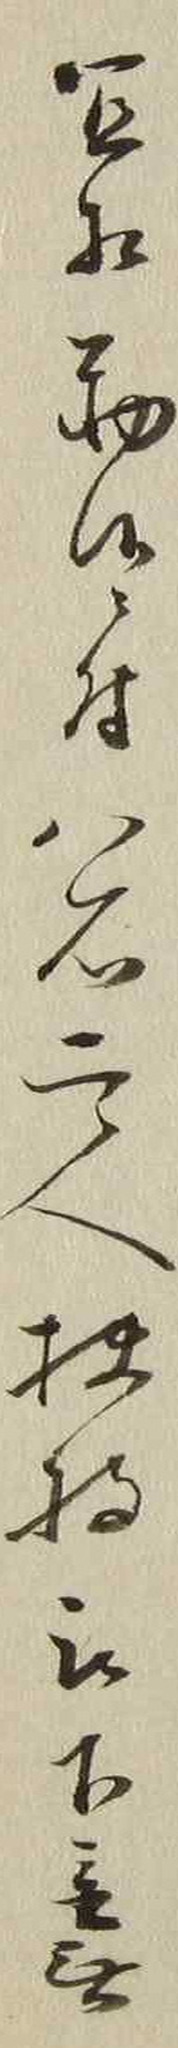宜相勤候ニ付八石二人扶持被下置無
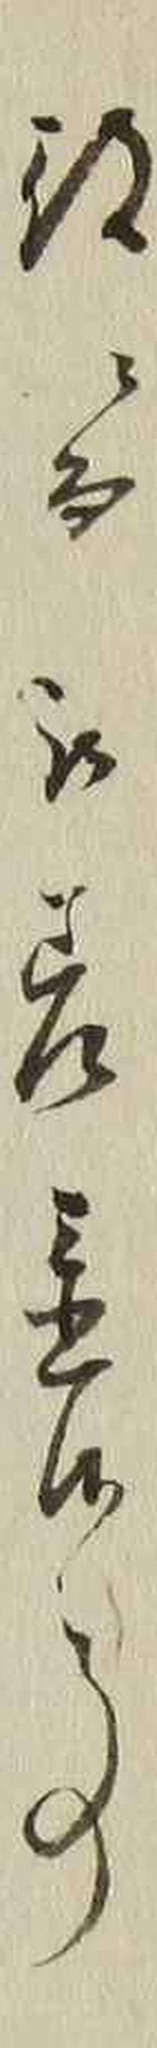役ニ而被差置候事
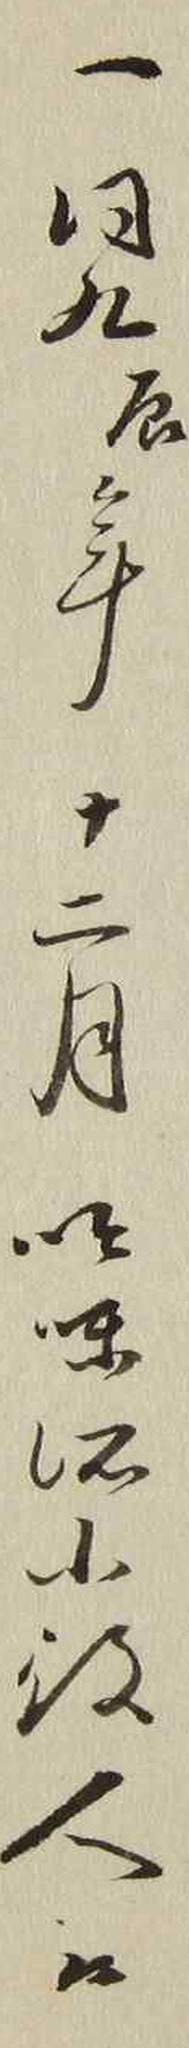一同九辰年十二月吟味所小役人被
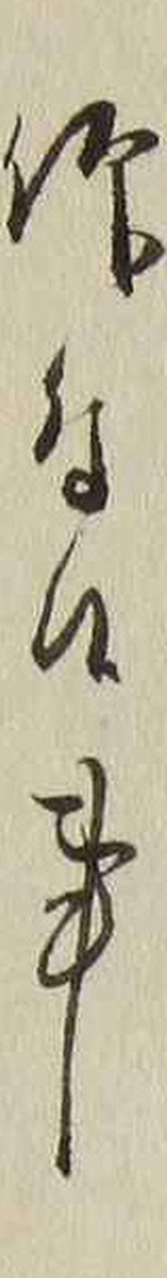仰付候事
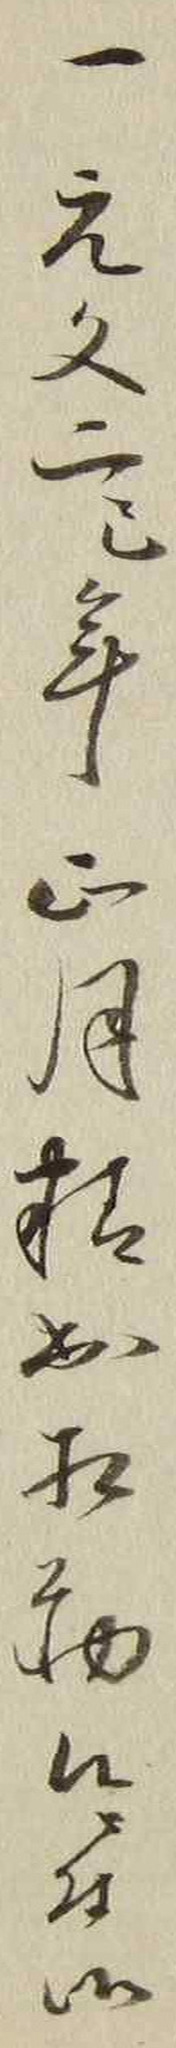一元文二巳年正月精出相勤候ニ付御
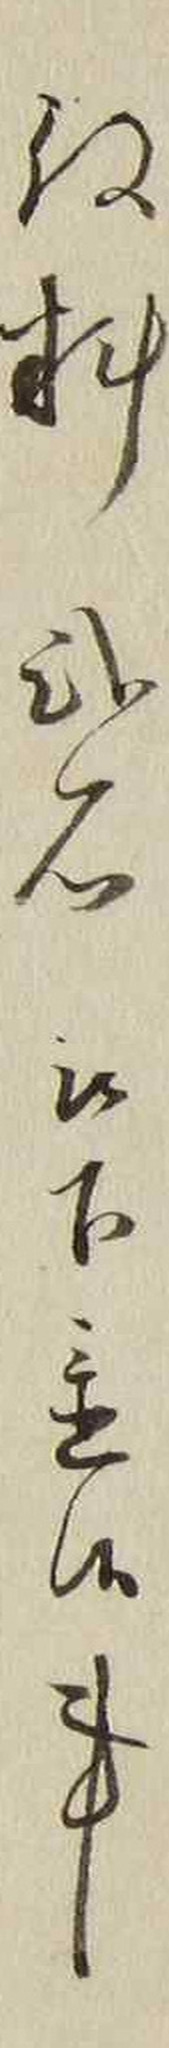役料弐石被下置候事
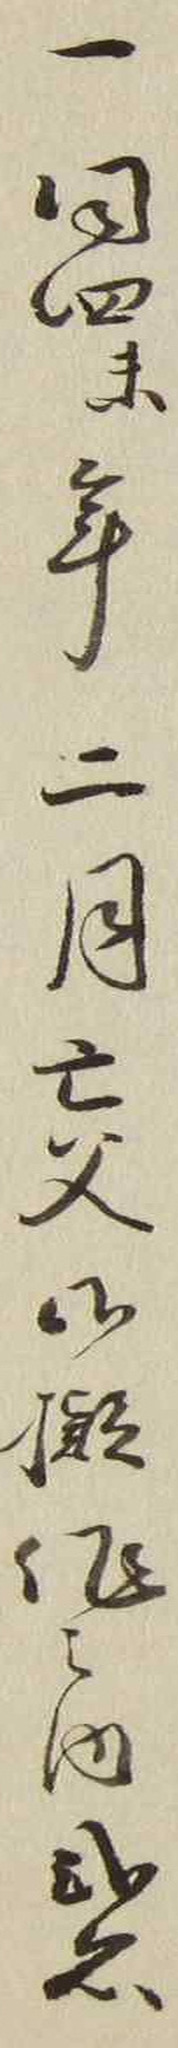一同四未年二月亡父御擬作之内弐石

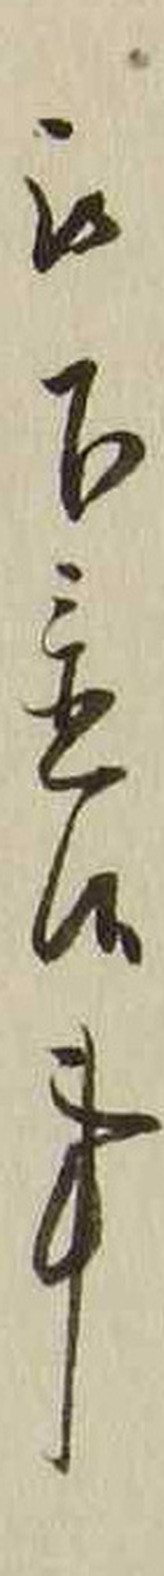被下置候事
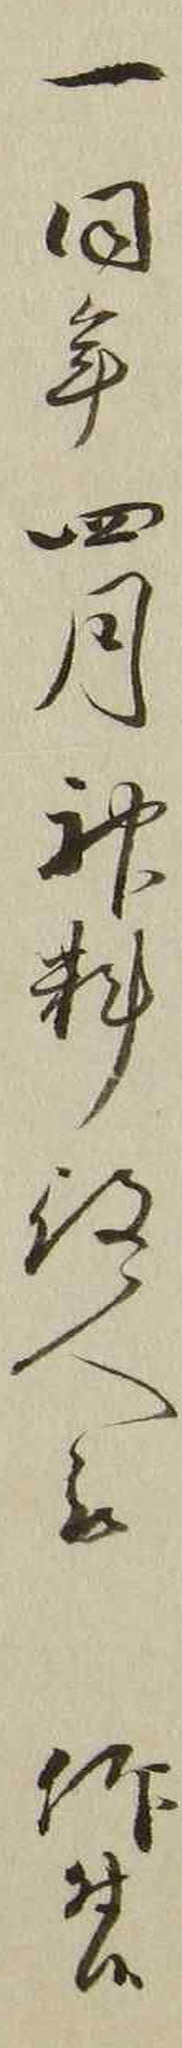一同年四月神料役人被仰付候
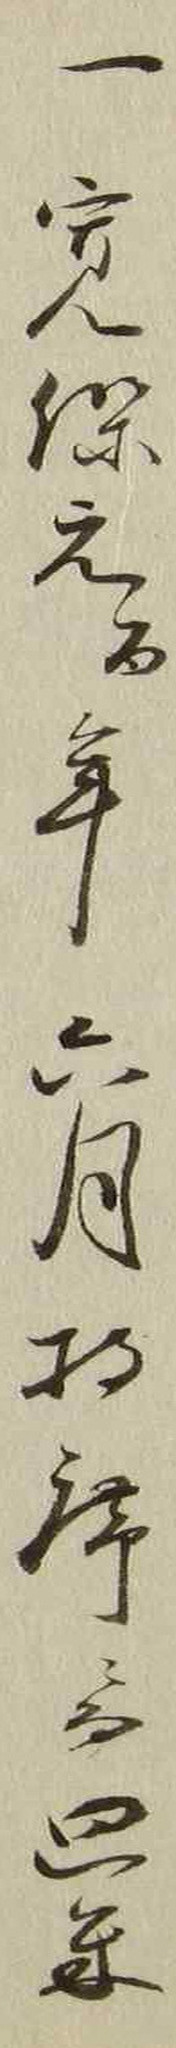一寛保元酉年六月持席ニ而廻米
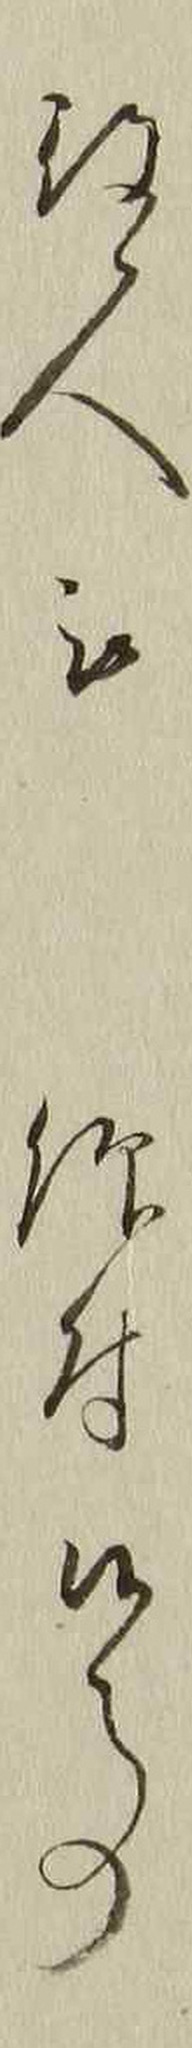役人被仰付候事
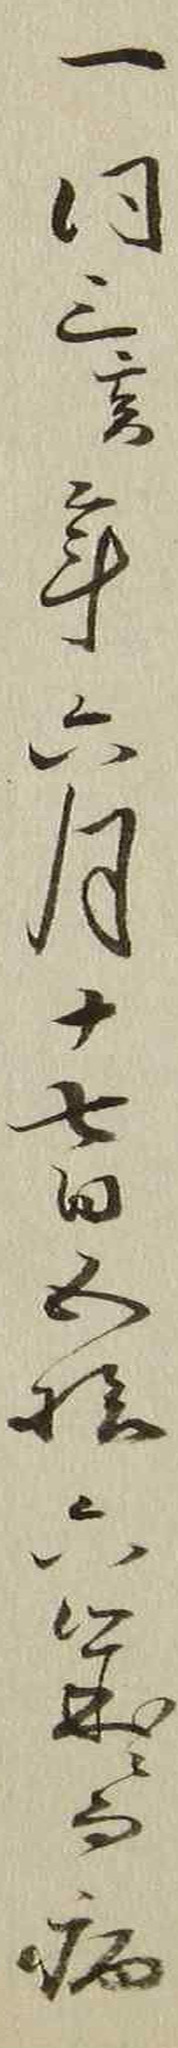一同三亥年六月十七日五拾六歳ニ而病
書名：諸士系譜　巻之52　に之部3
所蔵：会津若松市立会津図書館
